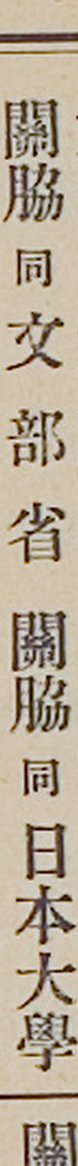関脇同文部省関脇同日本大学
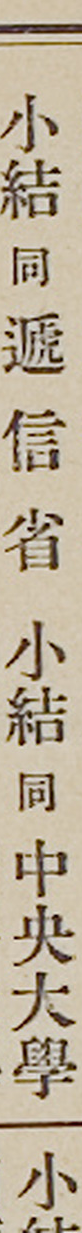小結同逓信省小結同中央大学
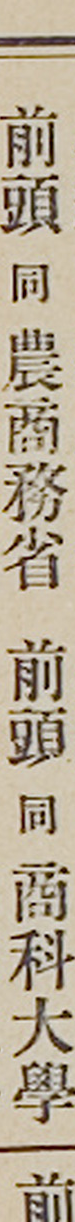前頭同農商務省前頭同商科大学
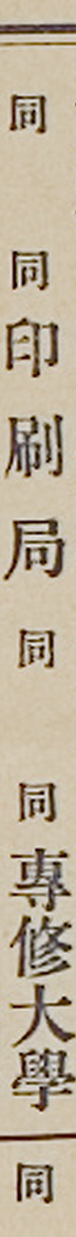同同印刷局同同専修大学
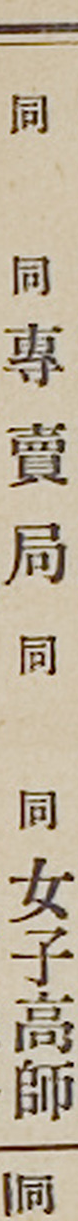同同専売局同同女子高師
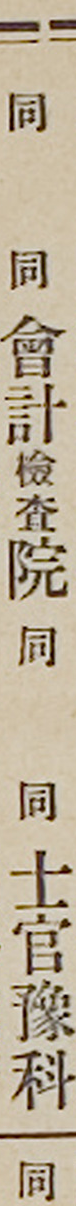同同会計検査院同同士官予科
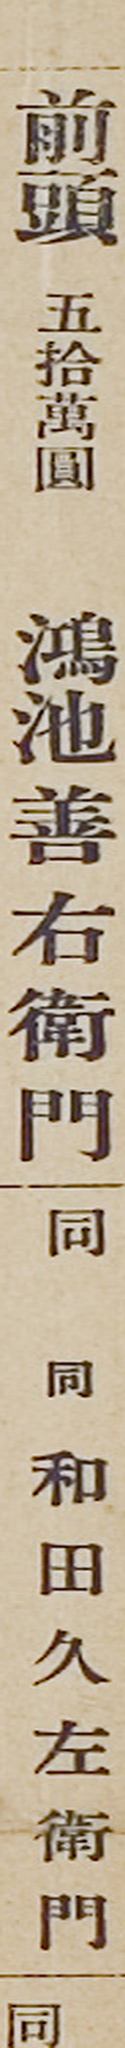前頭五拾万円鴻池善右衛門
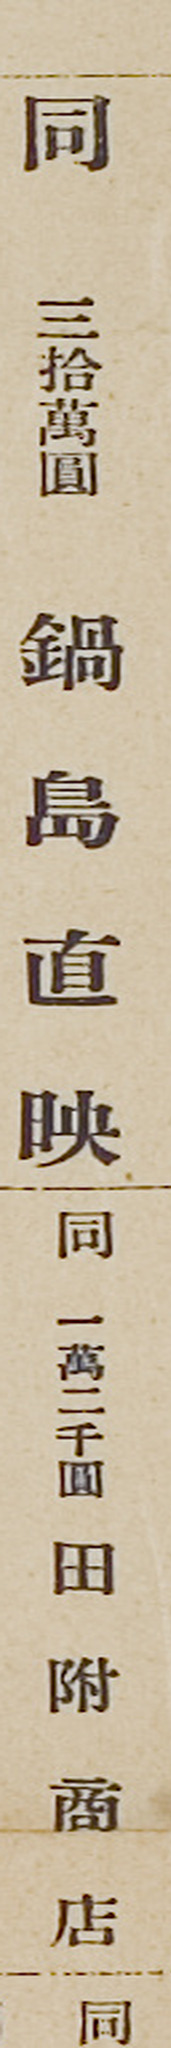同三拾万円鍋島直映
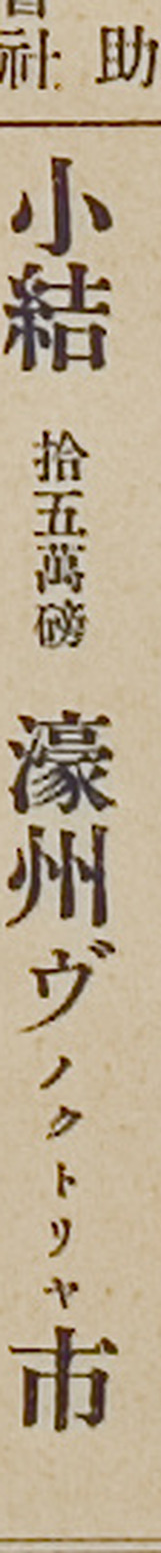小結拾五万磅濠州ヴノクトリヤ市
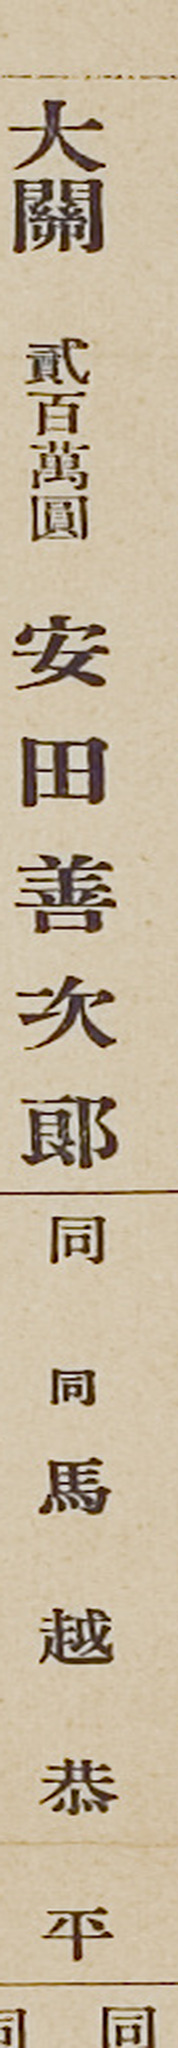大関弐百万円安田善次郎
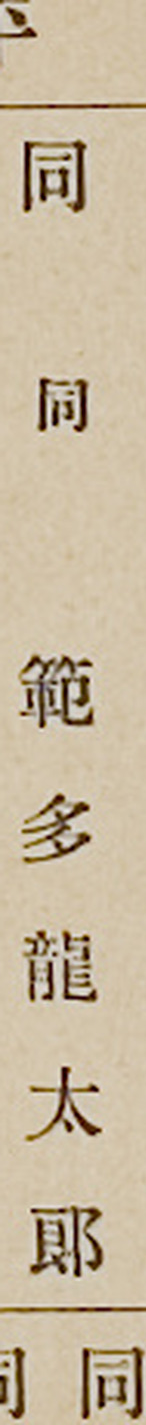同同範多龍太郎
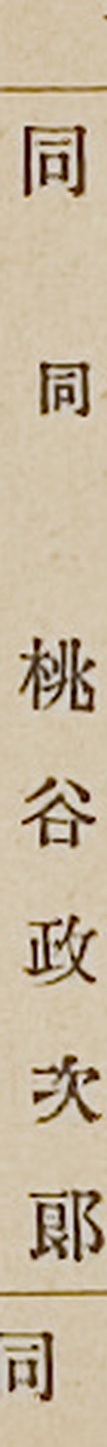同同桃谷政次郎
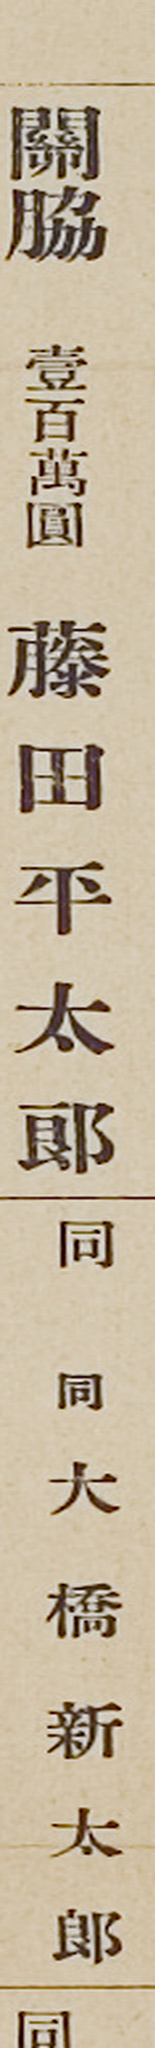関脇壱百万円藤田平太郎
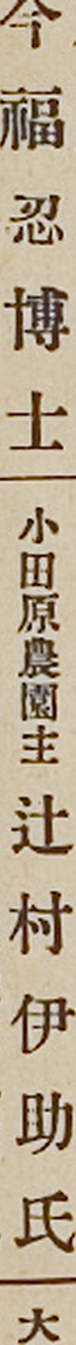小田原農園主辻村伊助氏
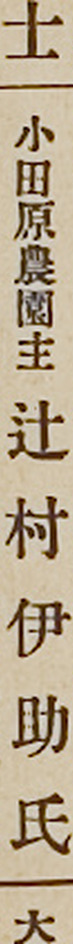小田原農園主辻村伊助氏
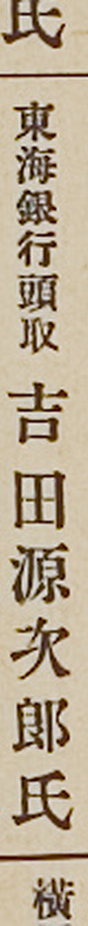東海銀行頭取吉田源次郎氏
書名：関東大震災大見立一覧表
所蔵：東京大学総合図書館 General Library in the University of Tokyo, JAPAN
